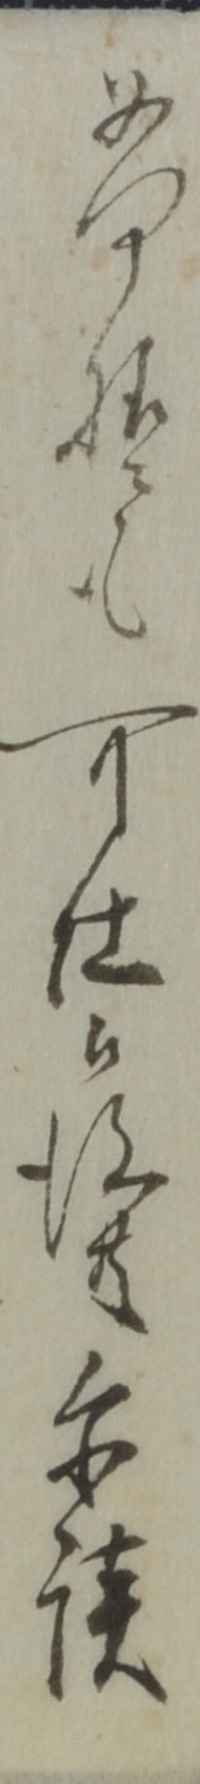如何様にも可仕候得共示談
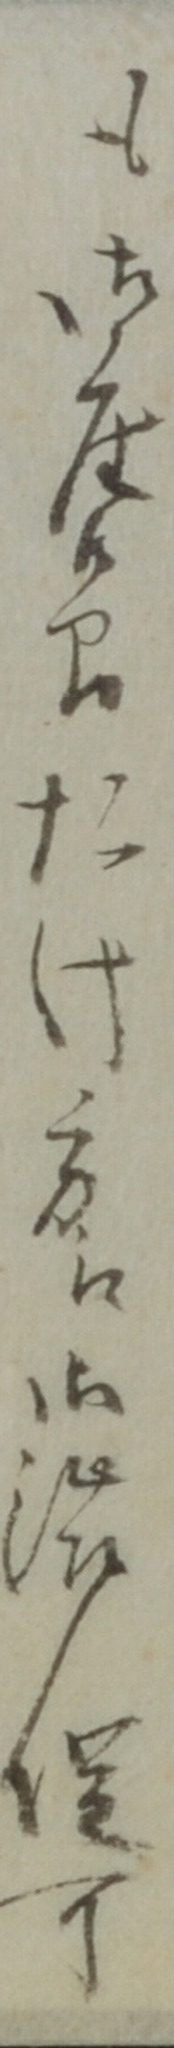も御座候間たけ方え御渋促可
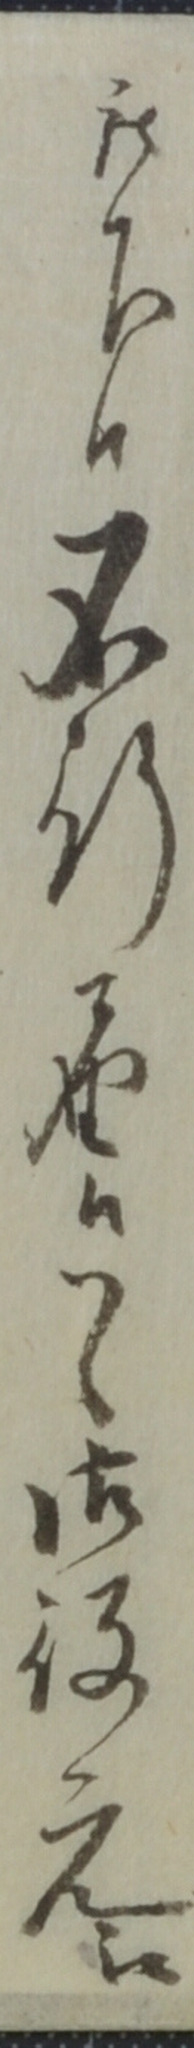被下候不行届候はゝ御役元え
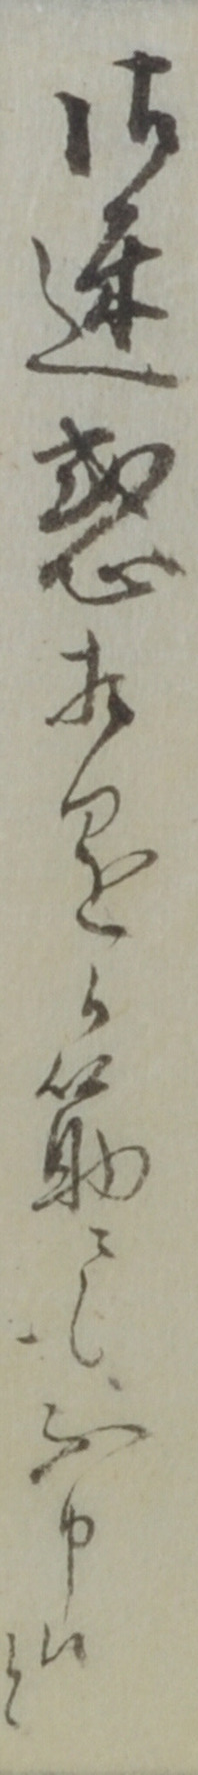御迷惑相懸候筋にも不申候と
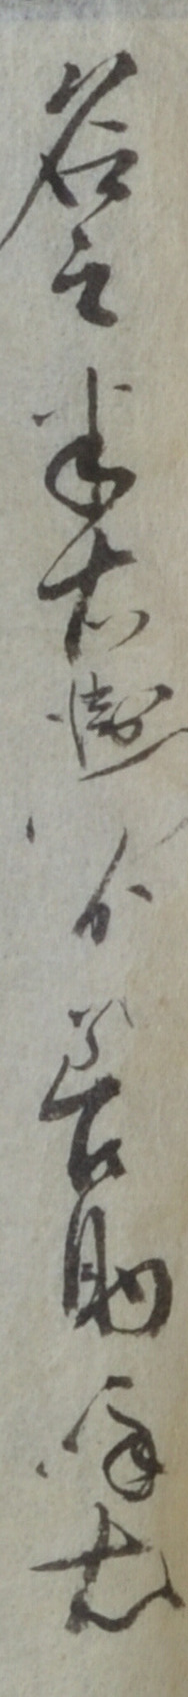名主半兵衛より善助呼右
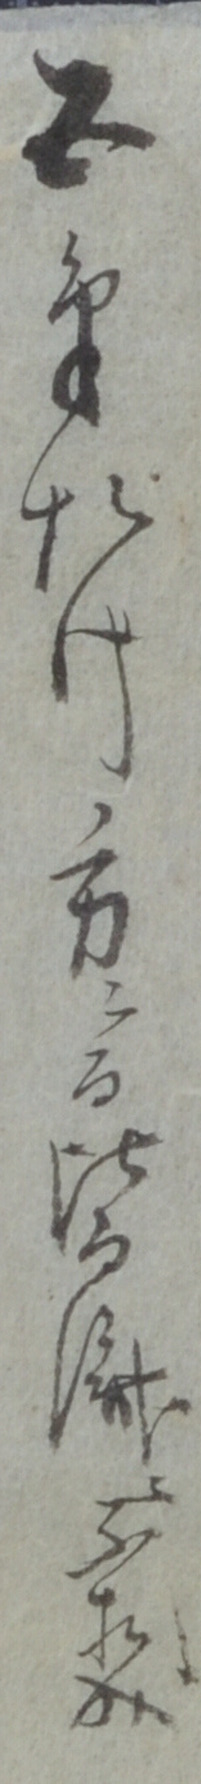五筆たけ方にて皆済に不相成
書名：口上之覚
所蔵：伊那市立高遠町図書館・合同会社AMANE
